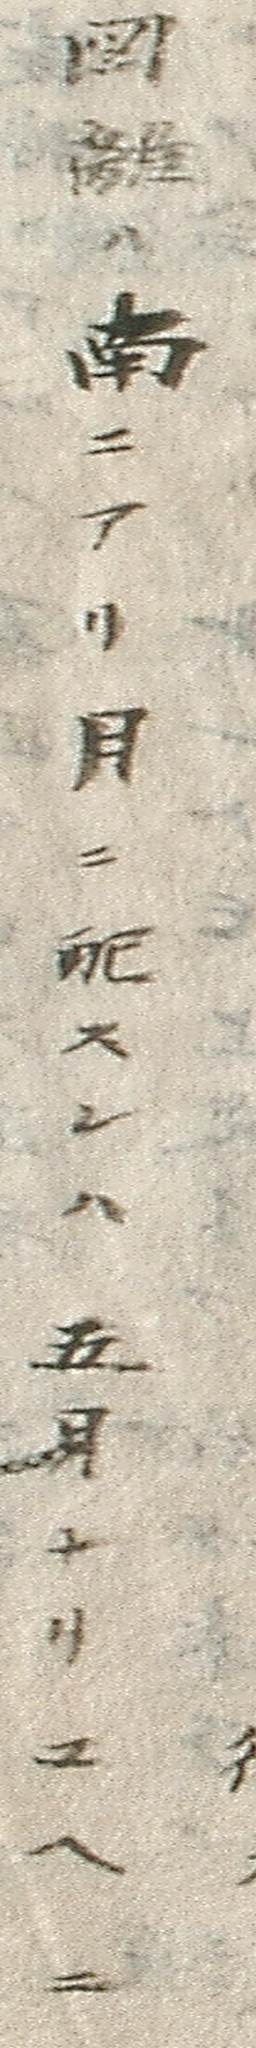図離ハ南ニアリ月ニ配スレハ五月ナリユヘニ
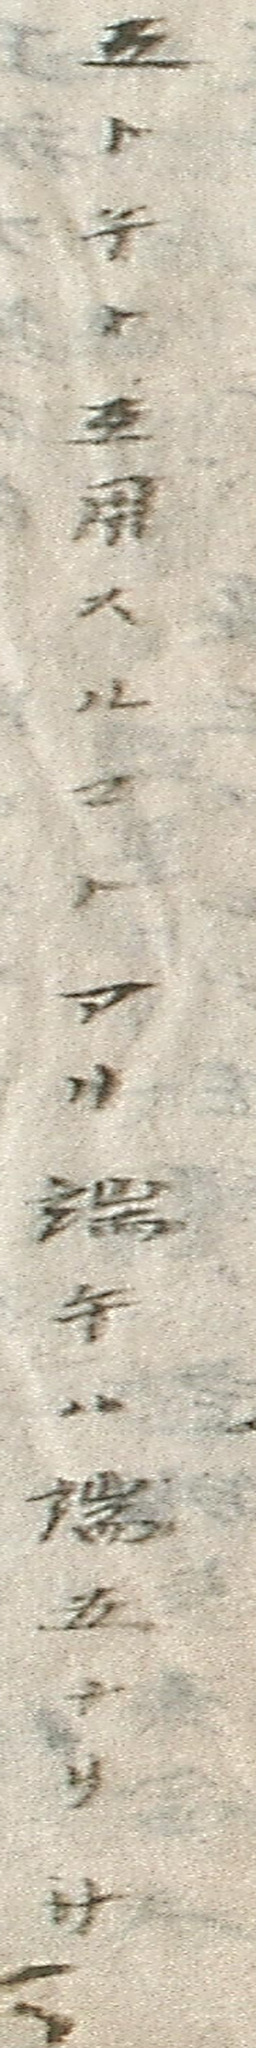五ト午ト互用スルコトアリ端午ハ端五ナリサ
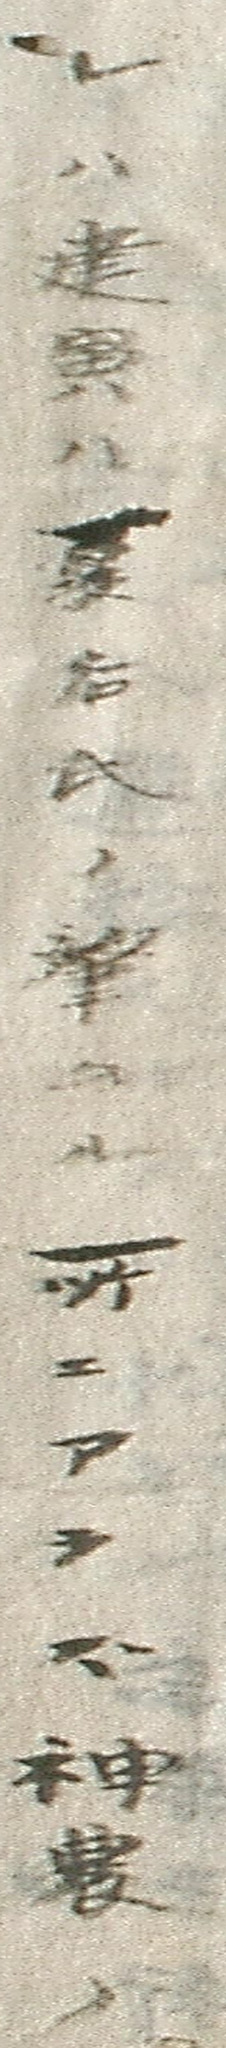レハ建寅ハ夏后氏ノ肇タル所ニアラズ神農ノ

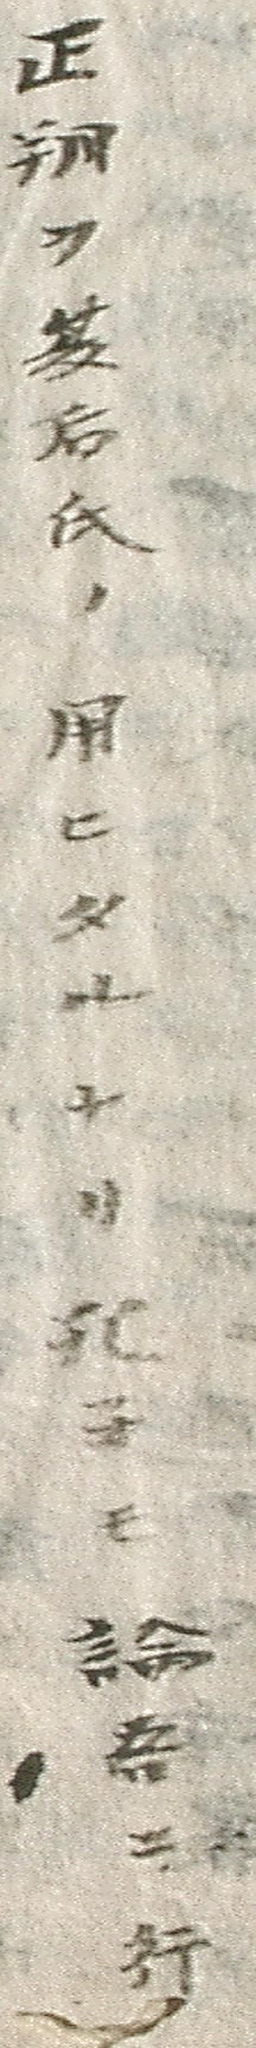正朔ヲ夏后氏ノ用ヒタルナリ孔子モ論吾ニ行
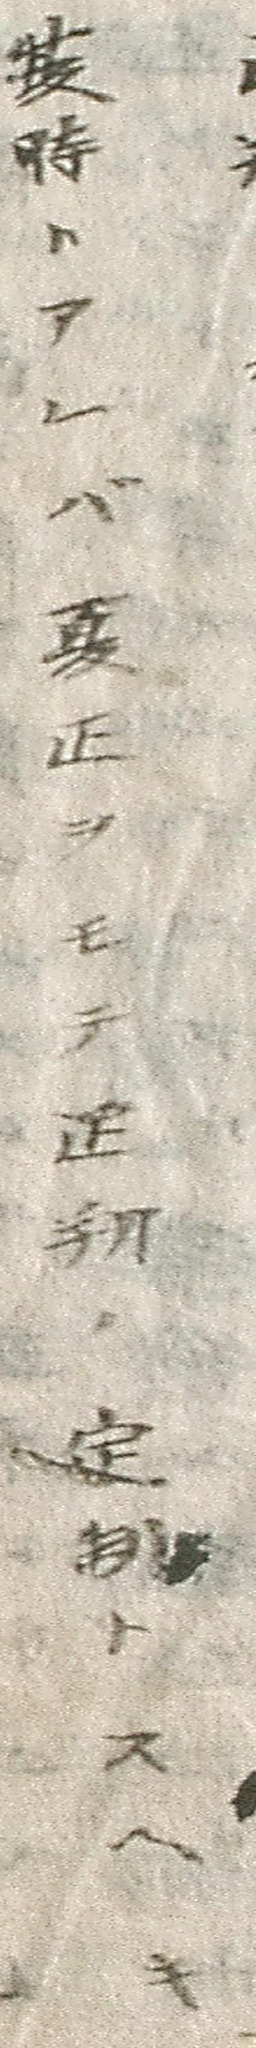夏時トアレバ夏正ヲモテ正朔ノ定制トスヘキ
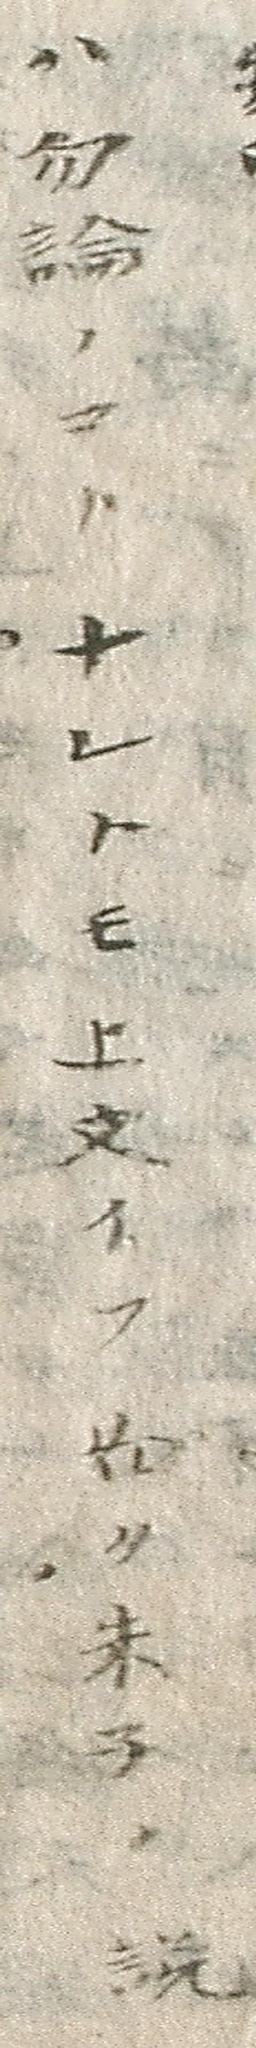ハ勿論ノコトナレトモ上文イフ如ク朱子ノ説
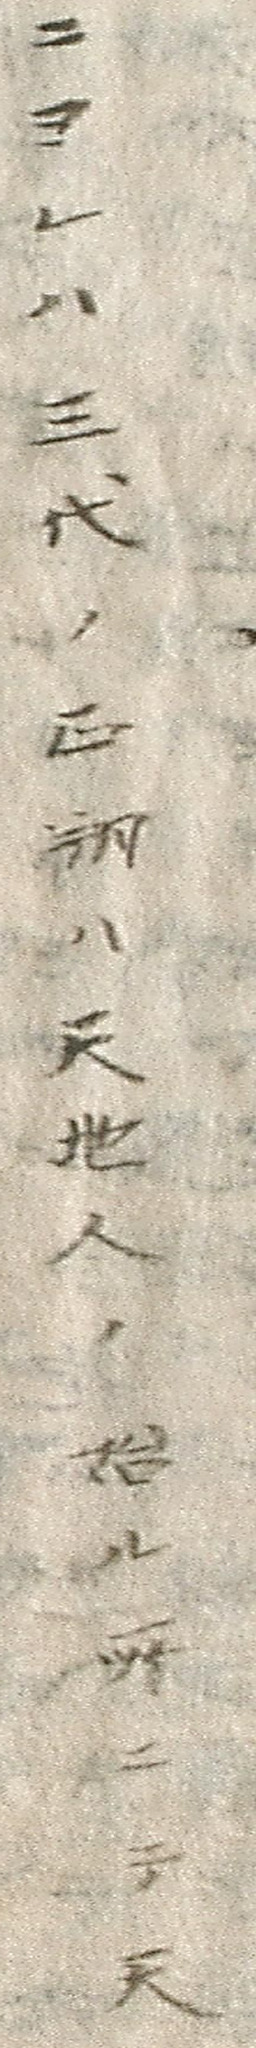ニヨレハ三代ノ正朔ハ天地人ノ始ル所ニテ天
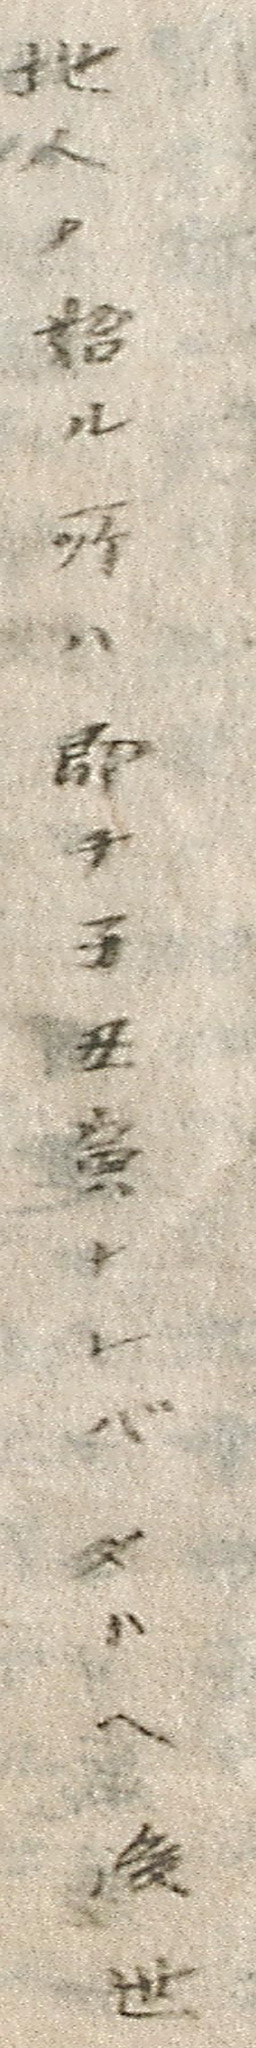地人ノ始ル所ハ即チ子丑寅ナレバタトヘ後世
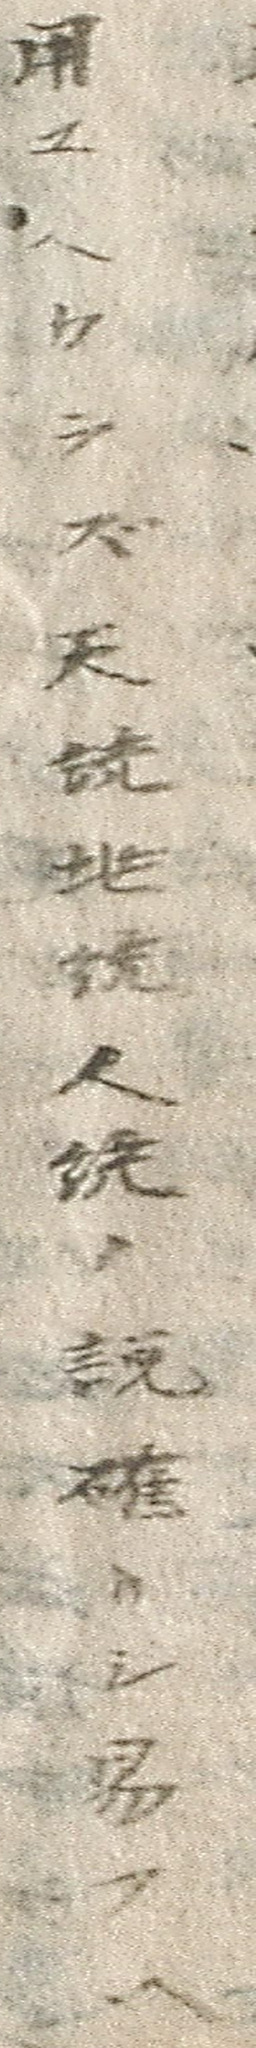用ユヘカラズ天統地統人統ノ説確リシ易フヘ
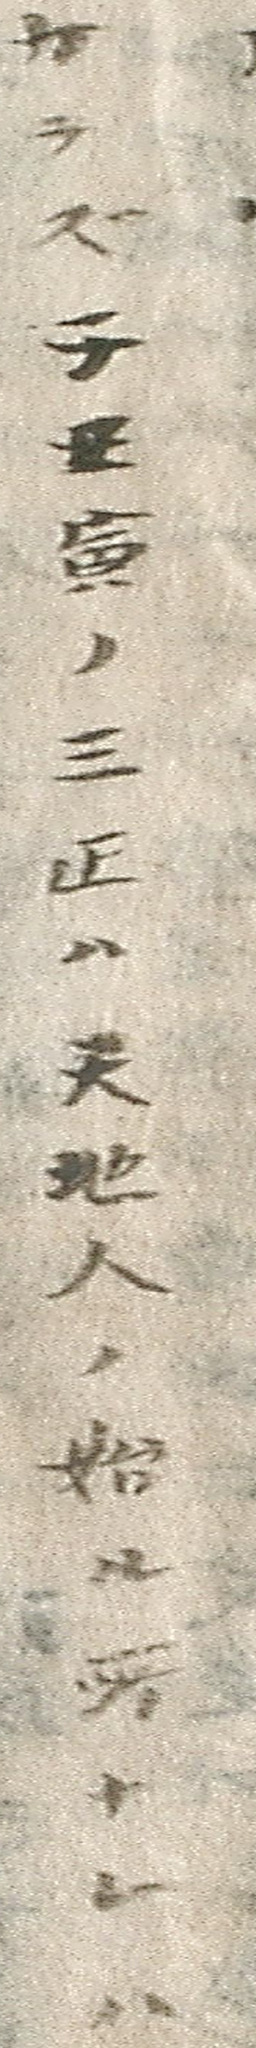カラズ子丑寅ノ三正ハ天地人ノ始ル所ナレハ
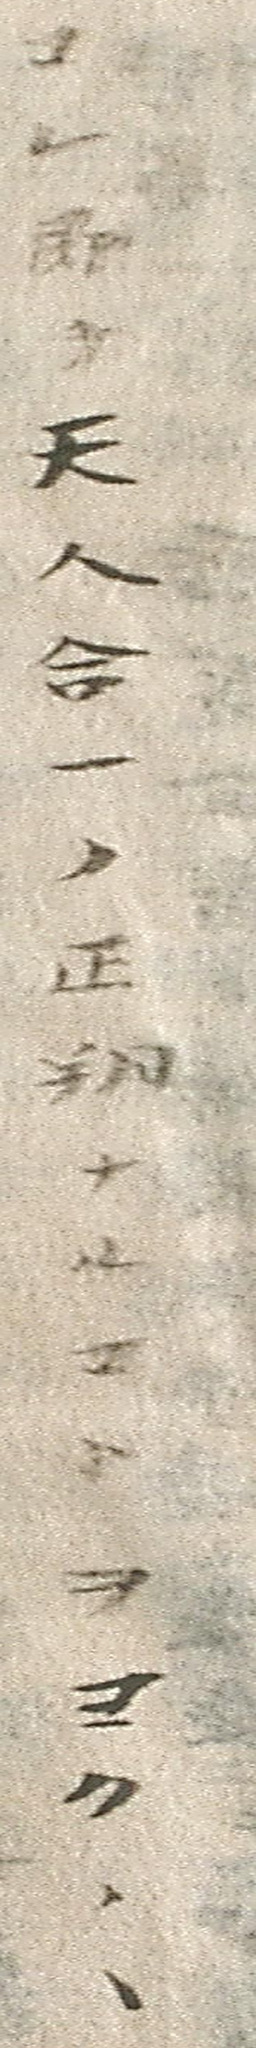コレ即チ天人合一ノ正朔ナルコトヲヨク〳〵
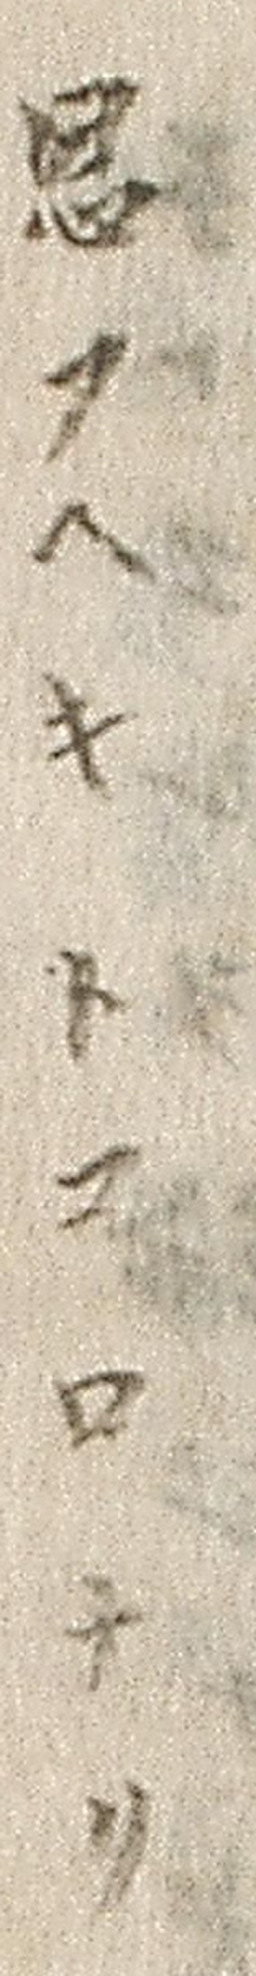思フヘキトコロナリ
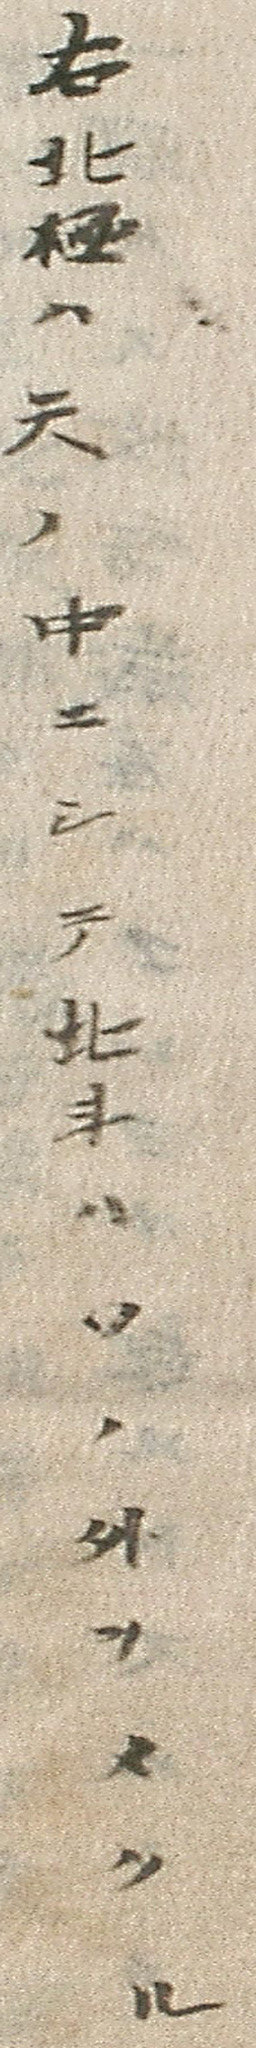右北極ハ天ノ中ニシテ北斗ハソノ外ヲメクル
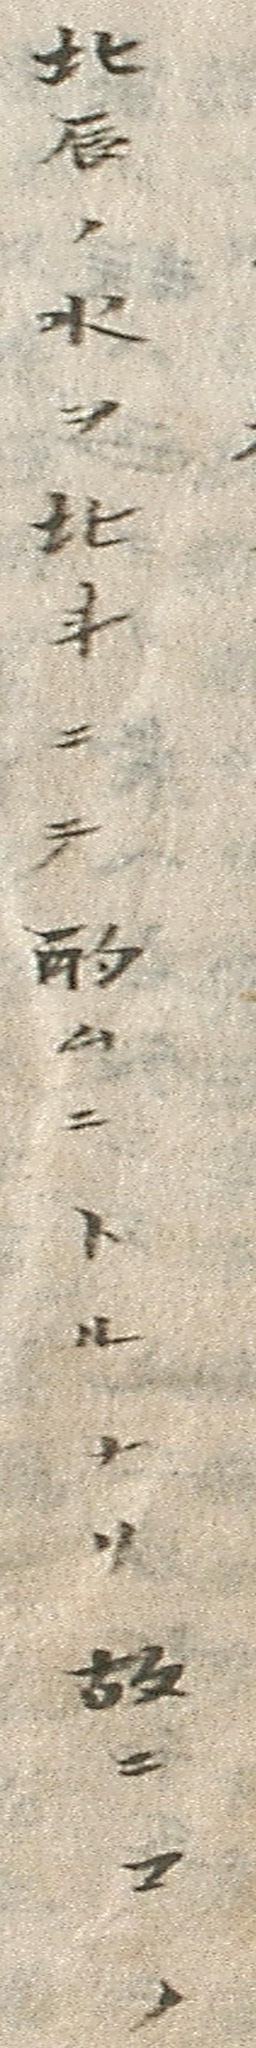北辰ノ水ヲ北斗ニテ酌ムニトルナリ故ニコノ
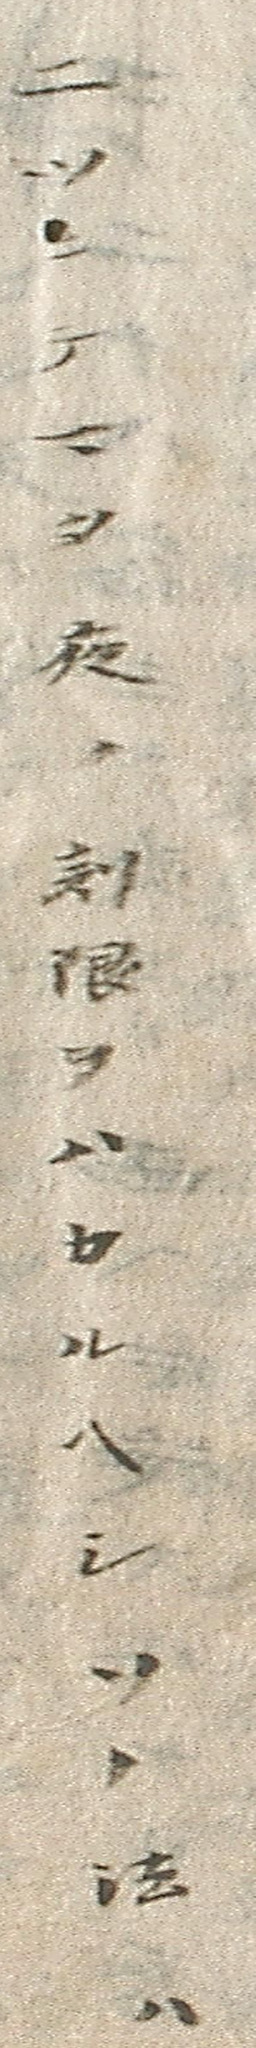ニツニテマタ夜ノ刻限ヲハカルヘシソノ法ハ
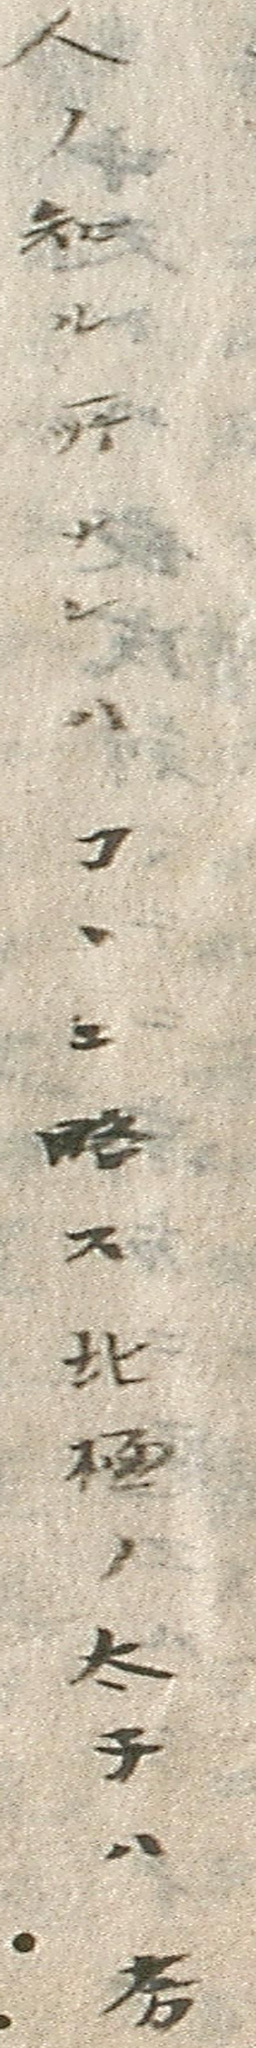人ノ知ル所ナレハコヽニ略ス北極ノ太子ハ房
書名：天學便蒙図説
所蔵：東京大学地震研究所図書室 Earthquake Research Institute Library, The University of Tokyo, JAPAN
